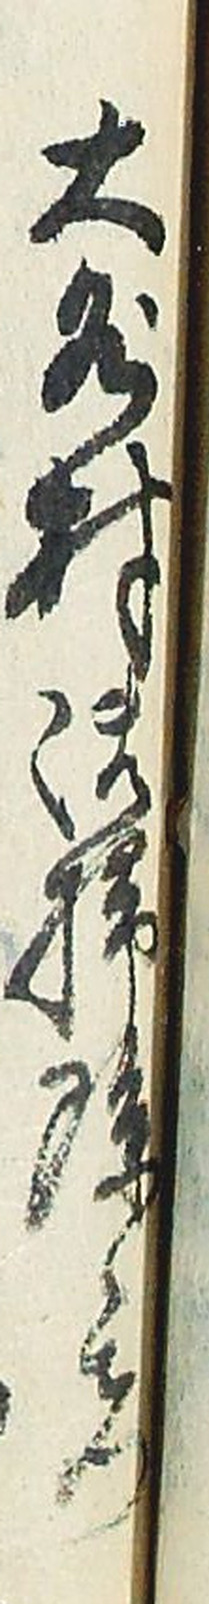大谷村御掃除之者
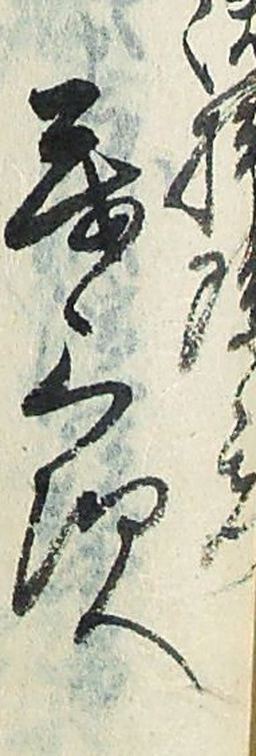茂三次
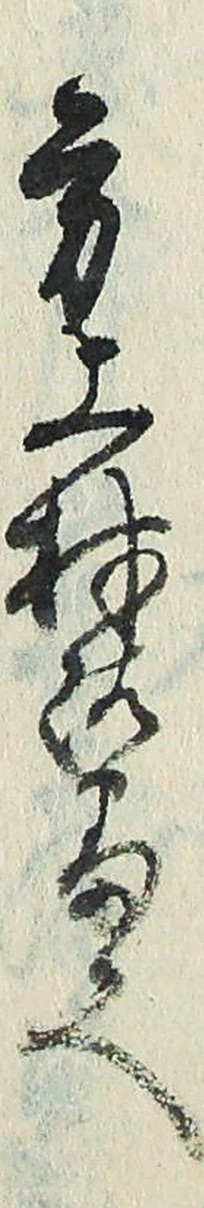方上村御番人
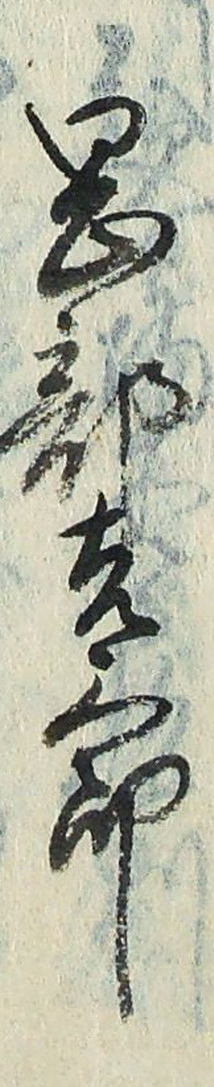岡部吉三郎
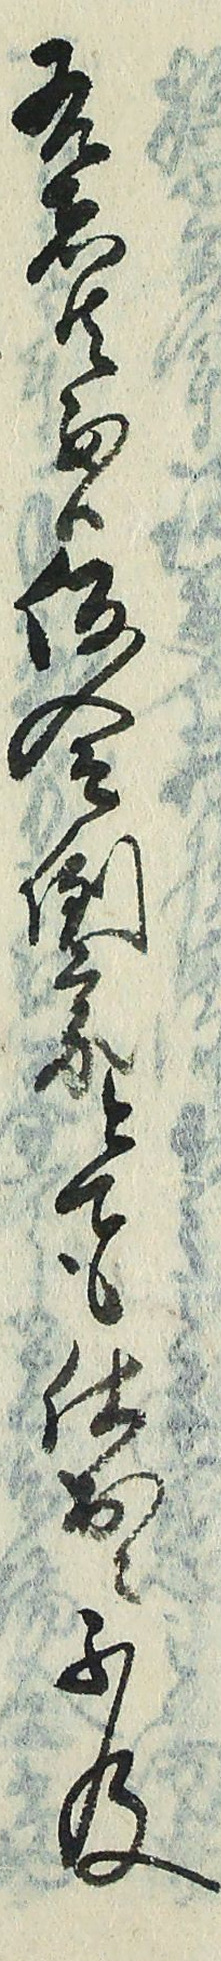右者共義ハ仮令倒家とても仕出ニ不及
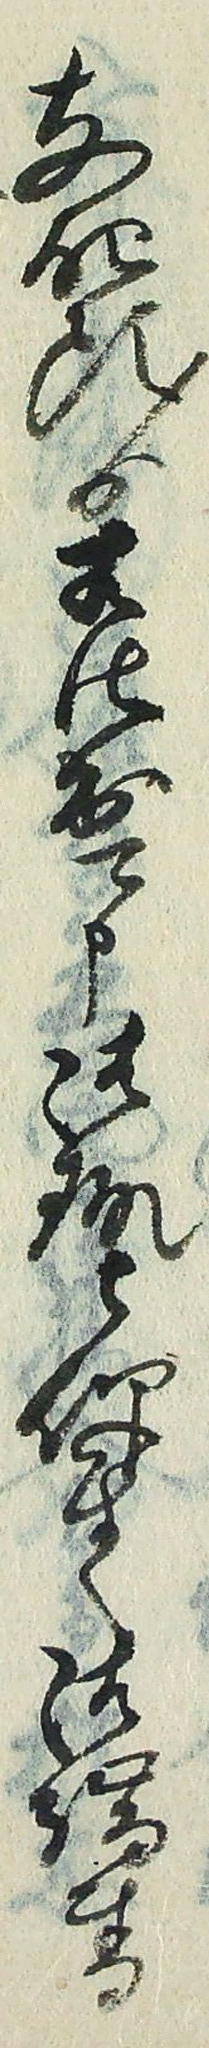支配頭ゟ相仕出可申御趣被仰付候御端書
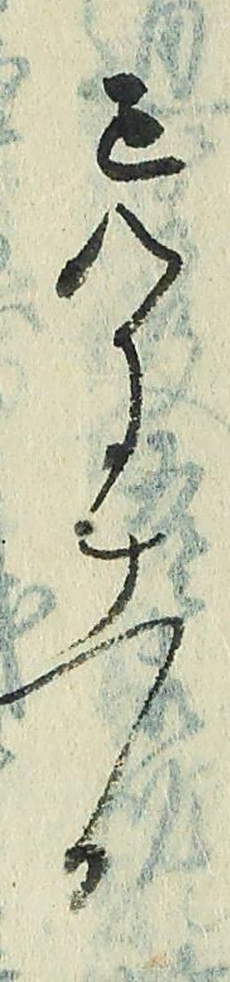巳八月十一日

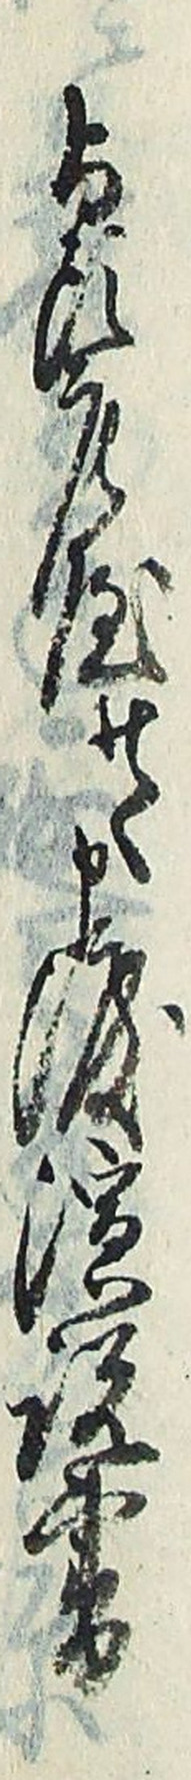与頭庄屋共へ申渡演説書
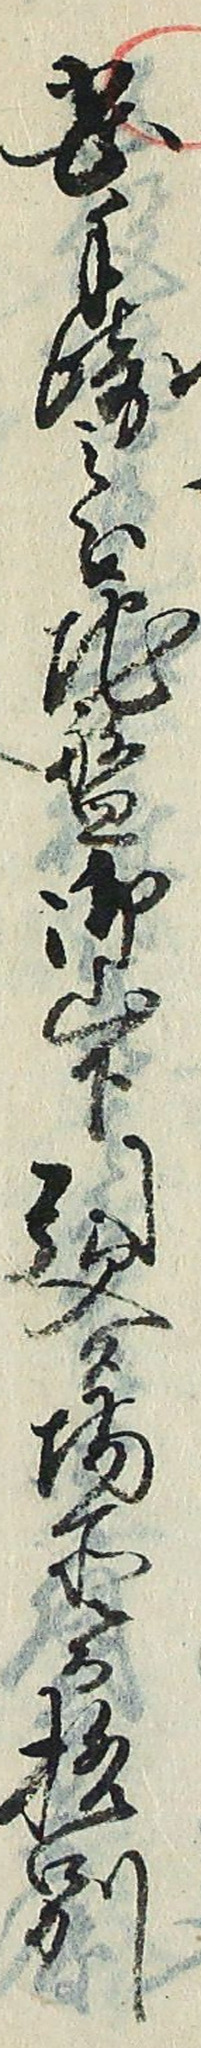當手崎之義地盤御山下引受候場所ニ而格別
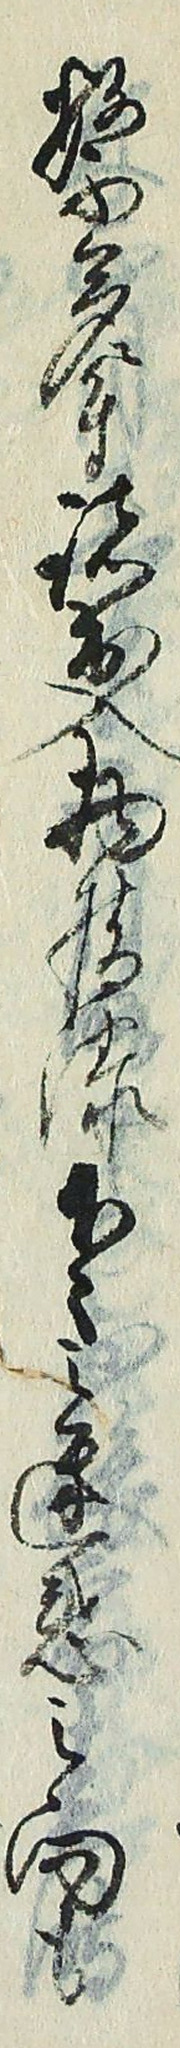繁多ニ付諸出入物指湊下々之迷惑之向も
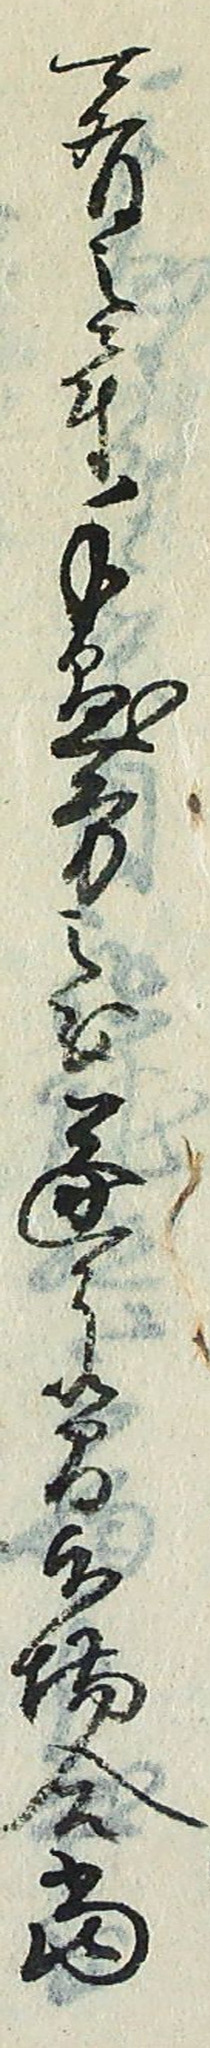可有之ニ付手懸方之義遂了簡候場合當
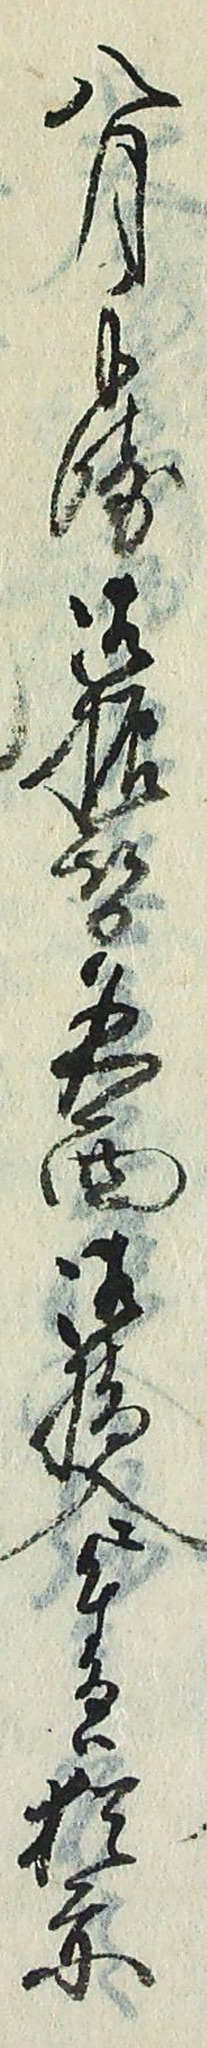八月手崎御振替名面御指入ニ付而ハ猶亦
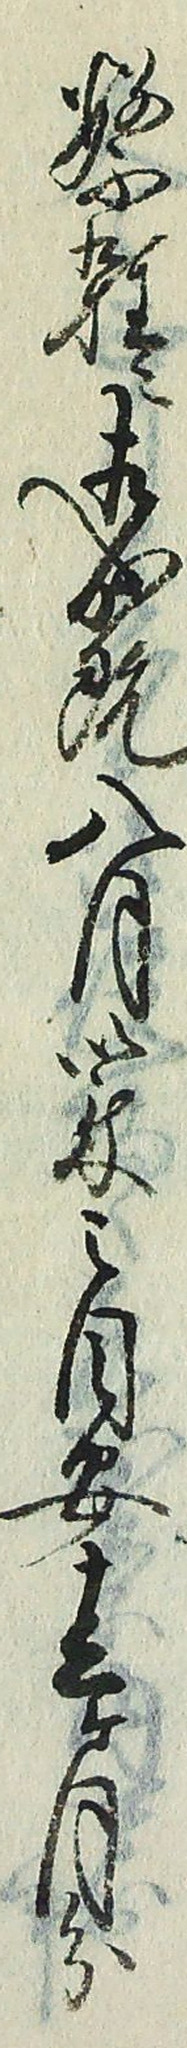繁雑ニ相成既八月以来之目安壱ケ月分
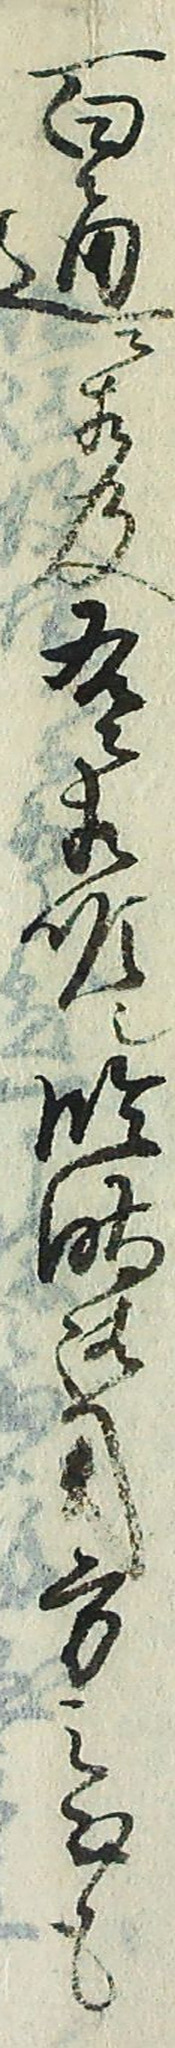百通ニ相及右ニ相順シ臨時御用方之義も
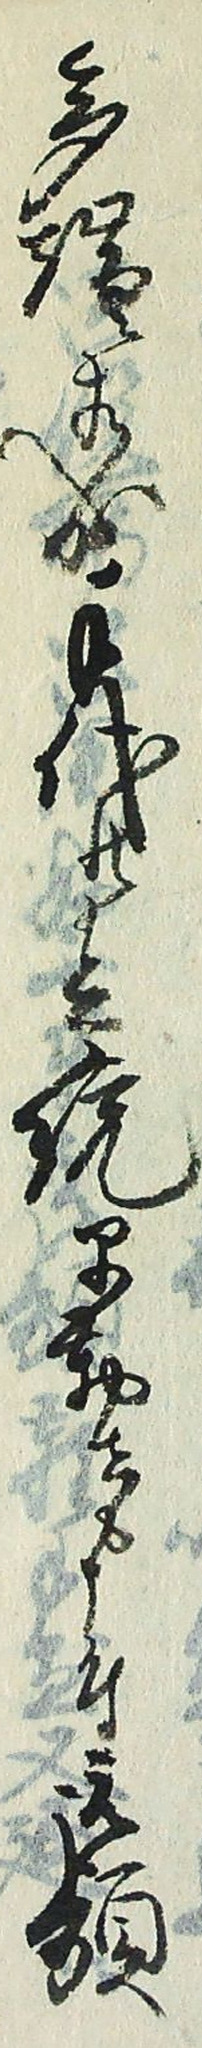多端ニ相成手代共壱統早勤をも申付取頻
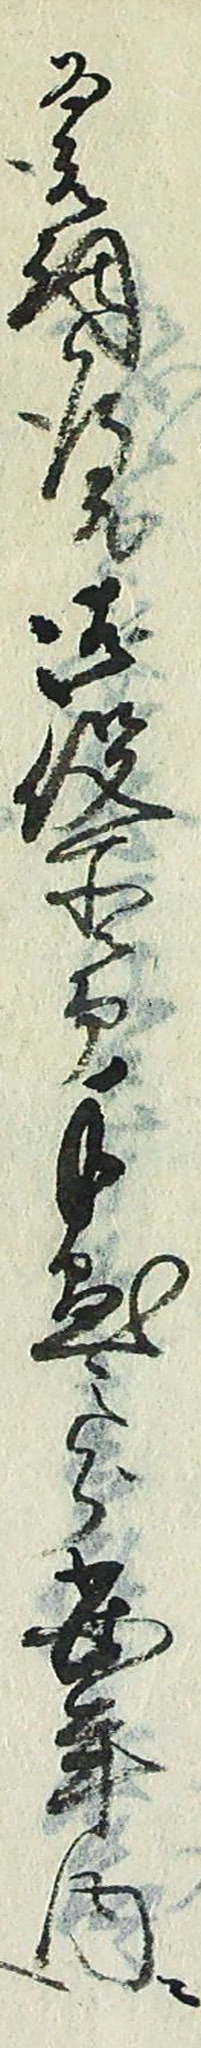為取調候得共御役所ニ而手懸之分當年内ニ
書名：諸御趣意書并御下知向之写
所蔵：鳴門教育大学 Naruto University of Education
